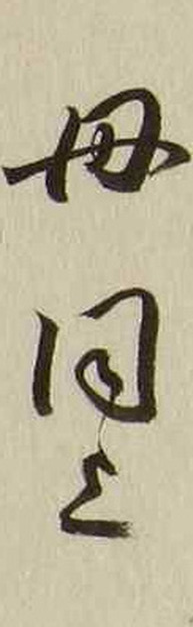母同上
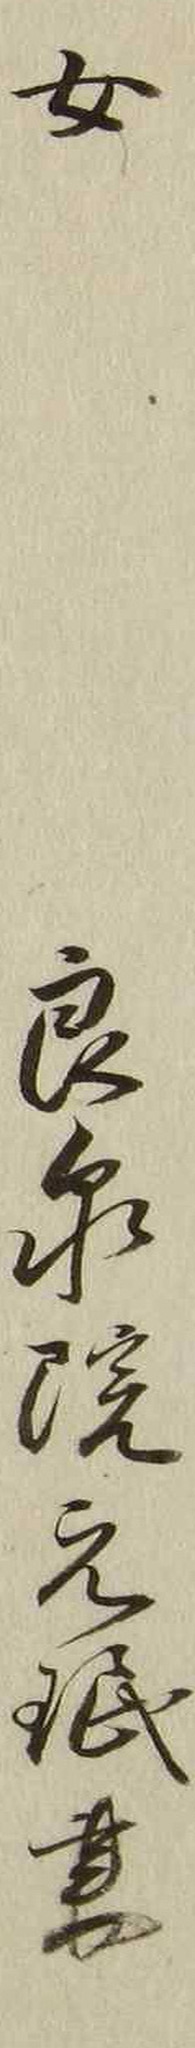女良泉院元珷妻
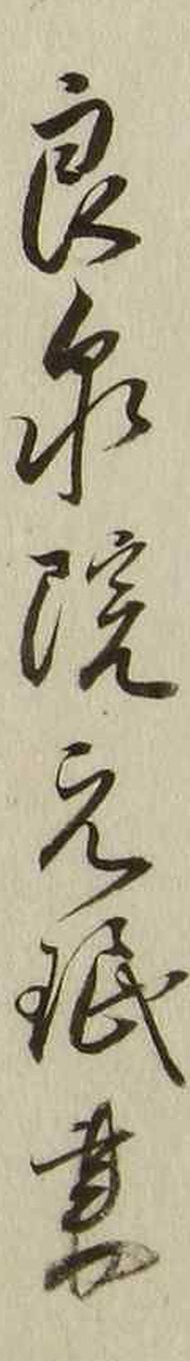女良泉院元珷妻
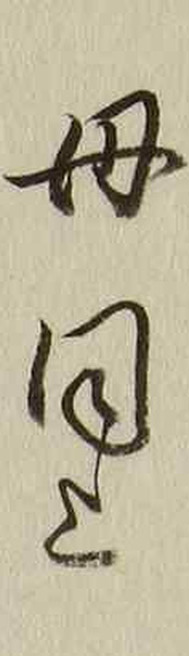母同上
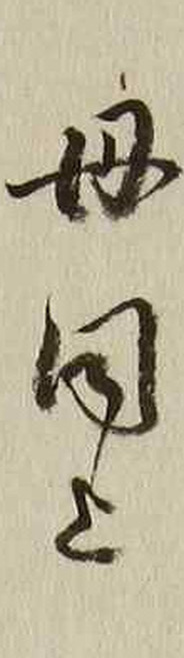母同上
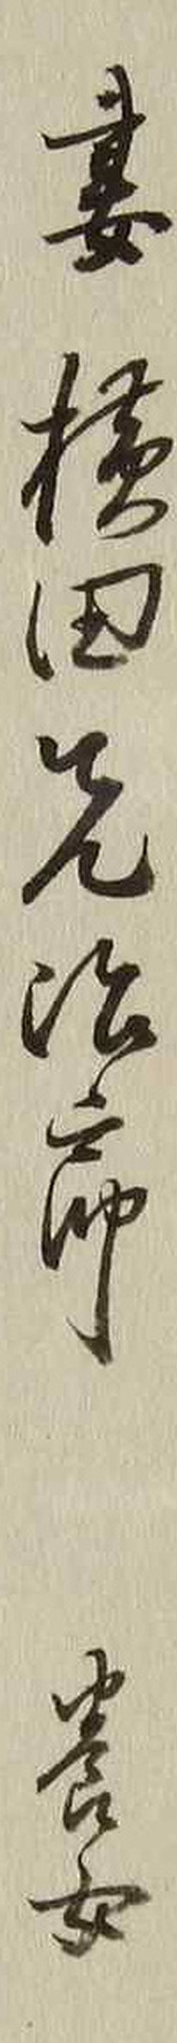妻横田先治郎養女
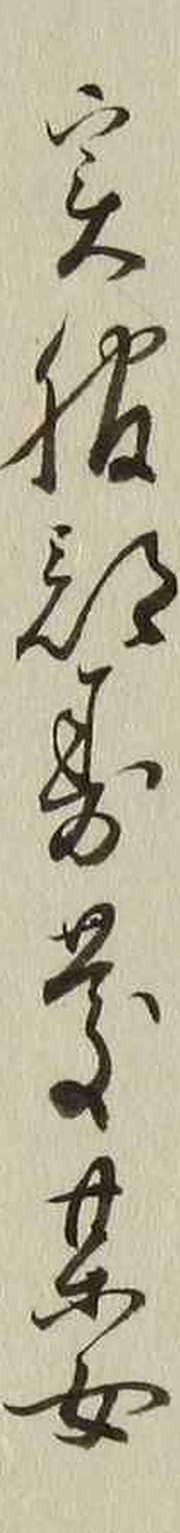実服部寿慶某女
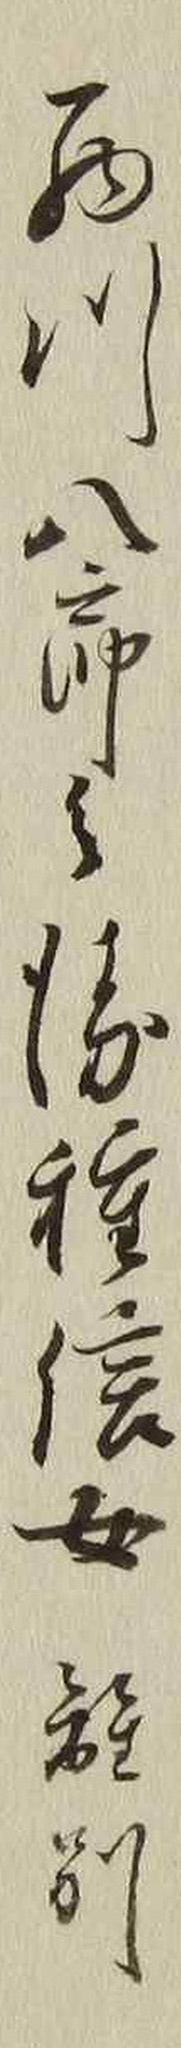西川八郎兵衛為信女離別
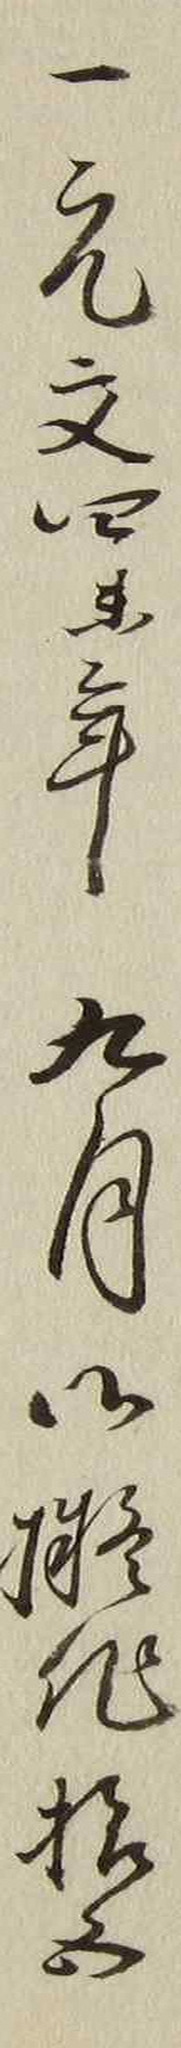一元文四未年九月御擬作拾五
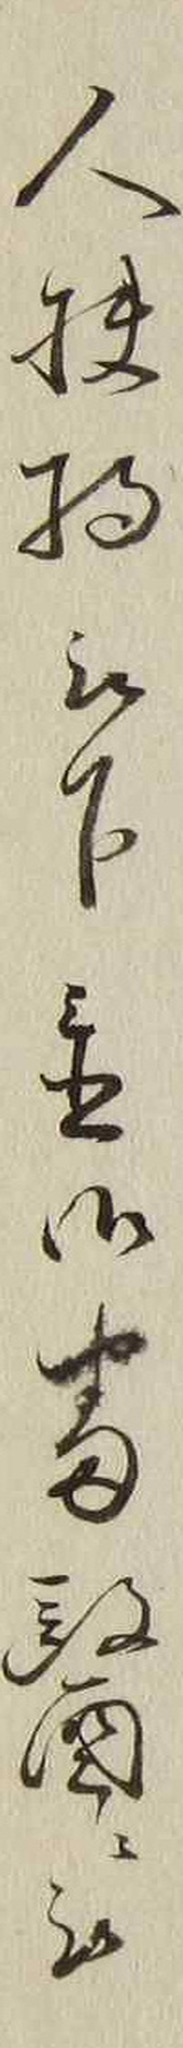人扶持被下置御番医ニ被
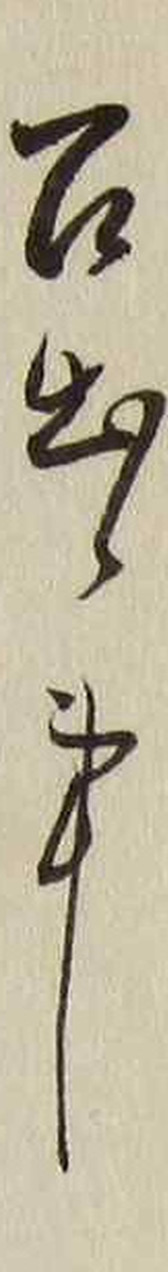召出候事

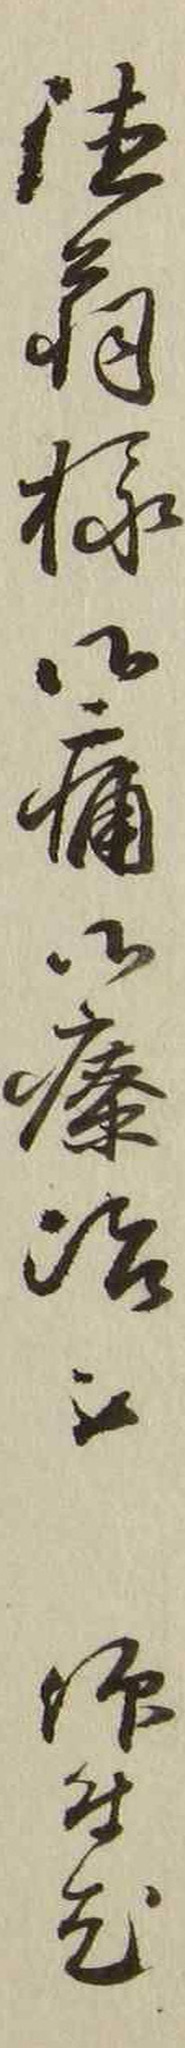徳翁様御痛御療治被仰付尤
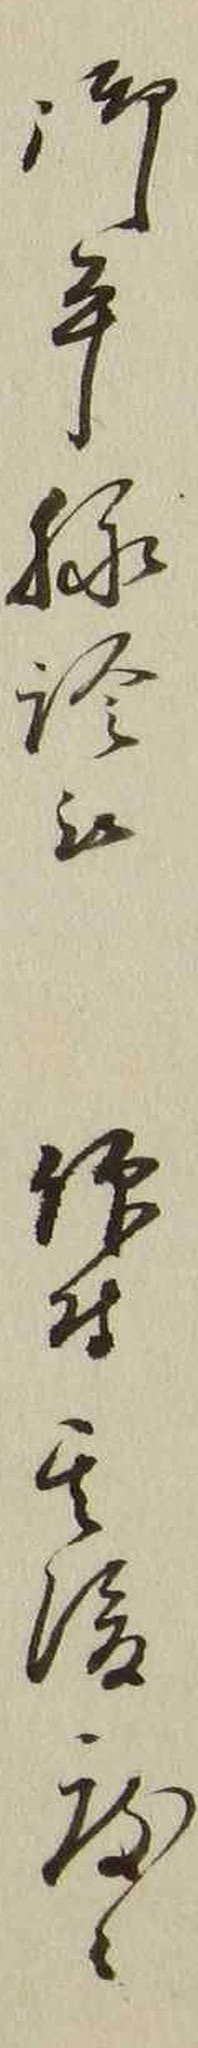御平脈診被仰付其後度々
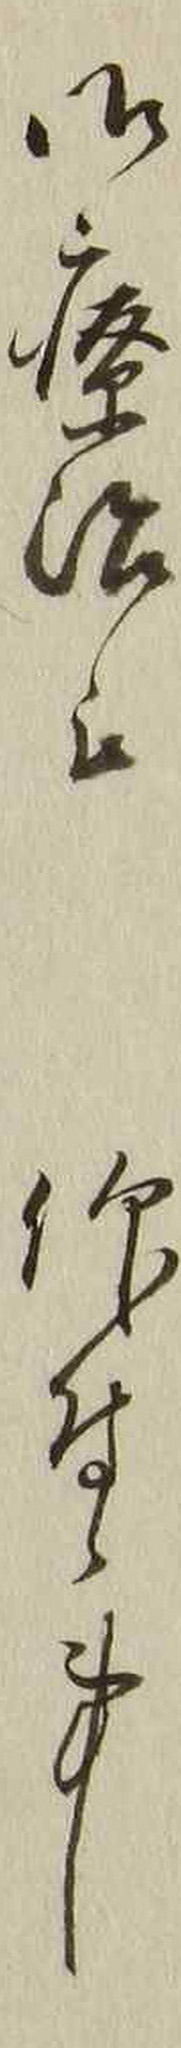御療治被仰付候事
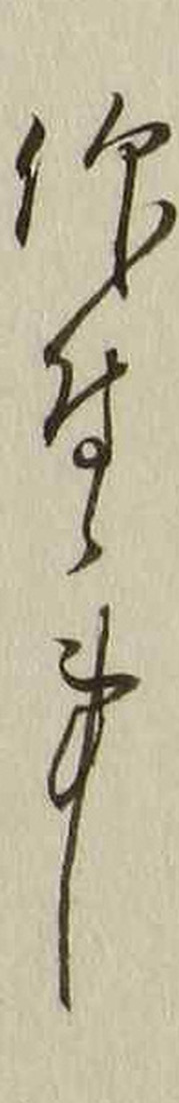仰渡候事
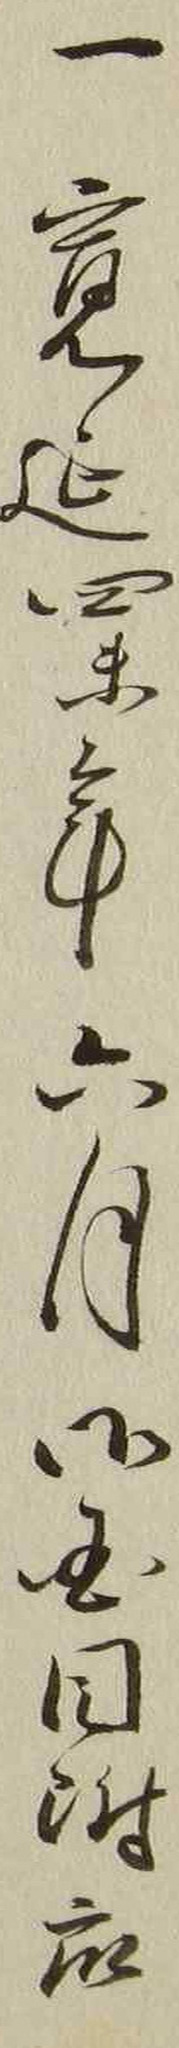一寛延四未年六月御国目附衆
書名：諸士系譜　巻之52　に之部3
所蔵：会津若松市立会津図書館
